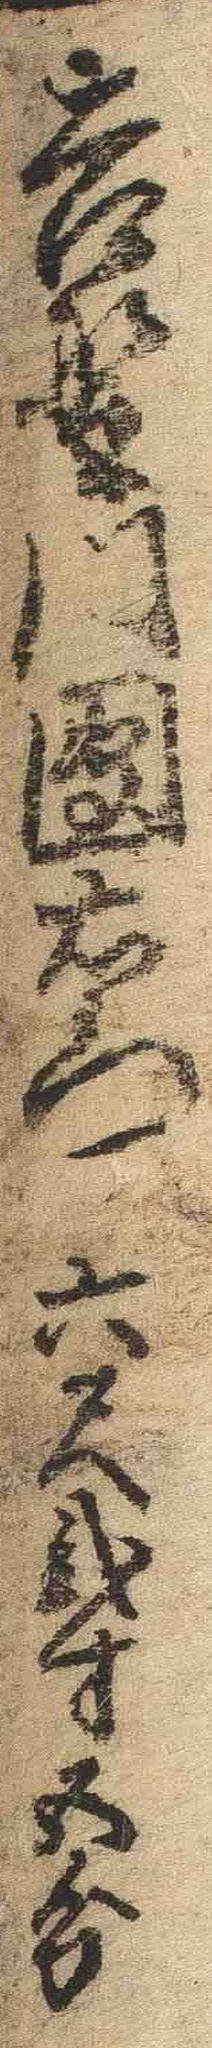吉野川団右衛門六尺弐寸五分
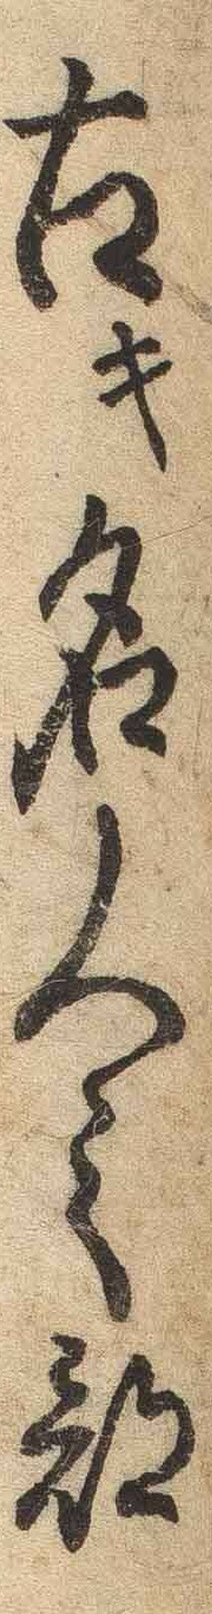古キ名人之部
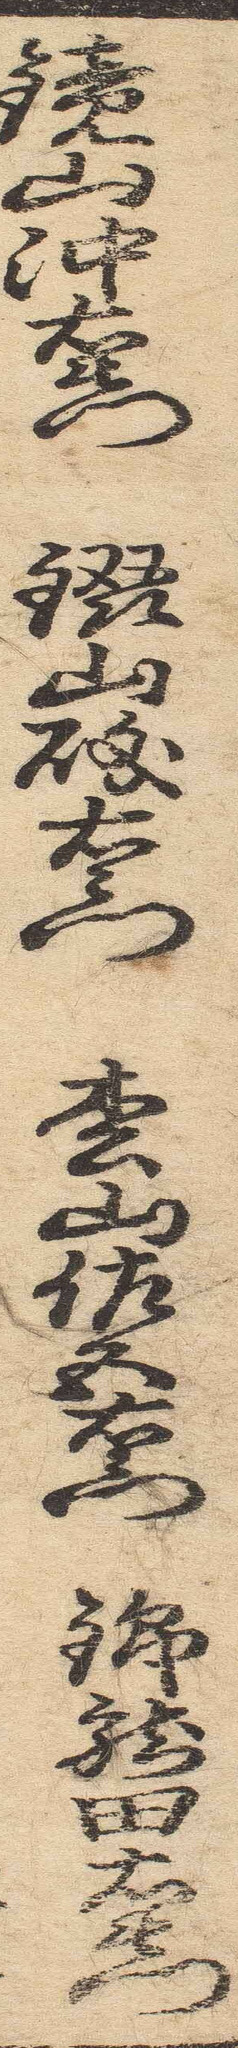鏡山沖右衛門錣山磯右衛門松山佐五五右衛門錦龍田右衛門
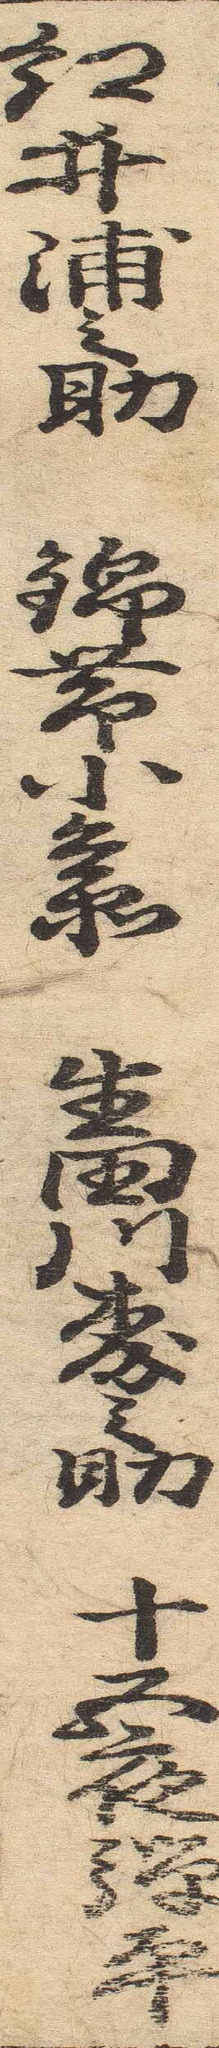紅井浦之助錦帯小兵衛生田川森之助十五夜弾平
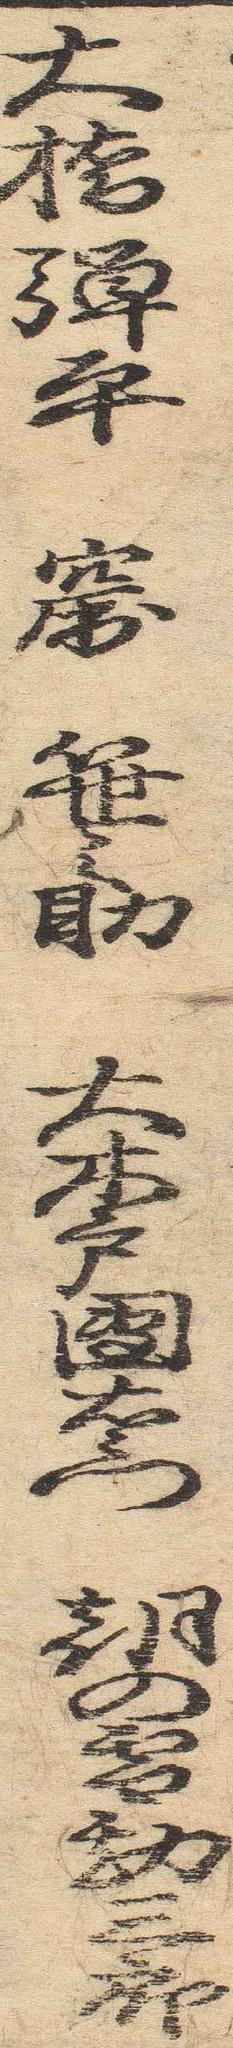大橋弾平窟笹之助大木戸団右衛門朝の雷勘三郎
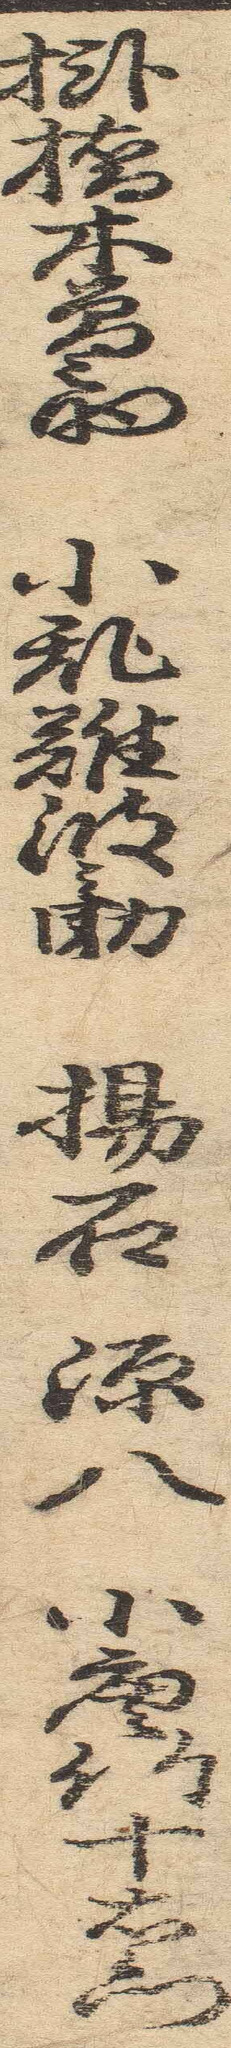掛橋木曽之助小乱難波之助揚石源八小唐竹十右衛門
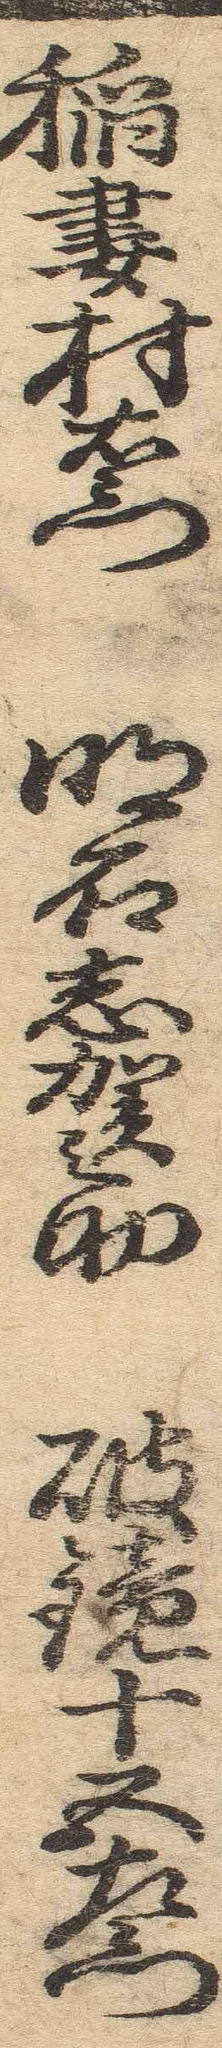稲妻村右衛門明石志賀之助破鏡十五左衛門

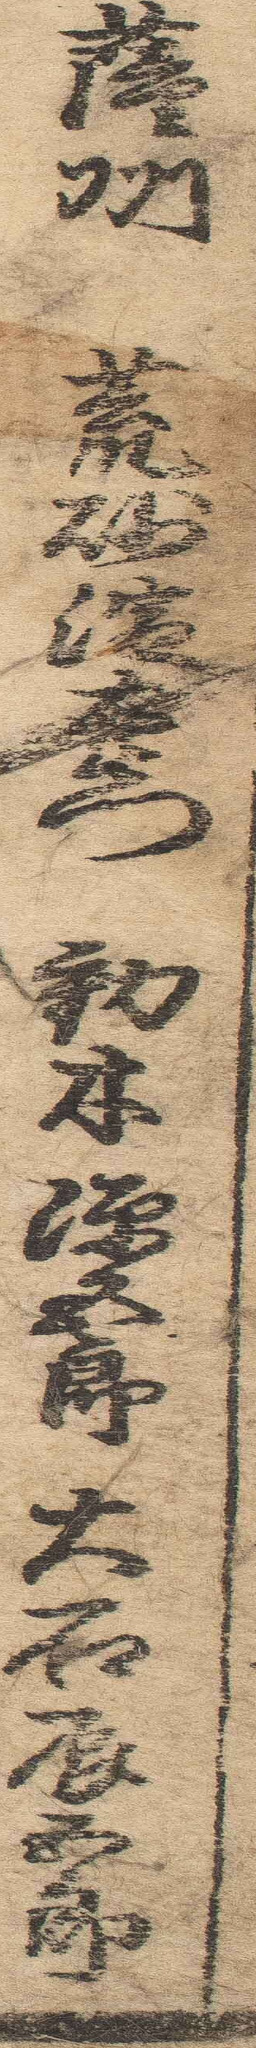薩州荒砂浜右衛門勘木源五郎大石辰五郎
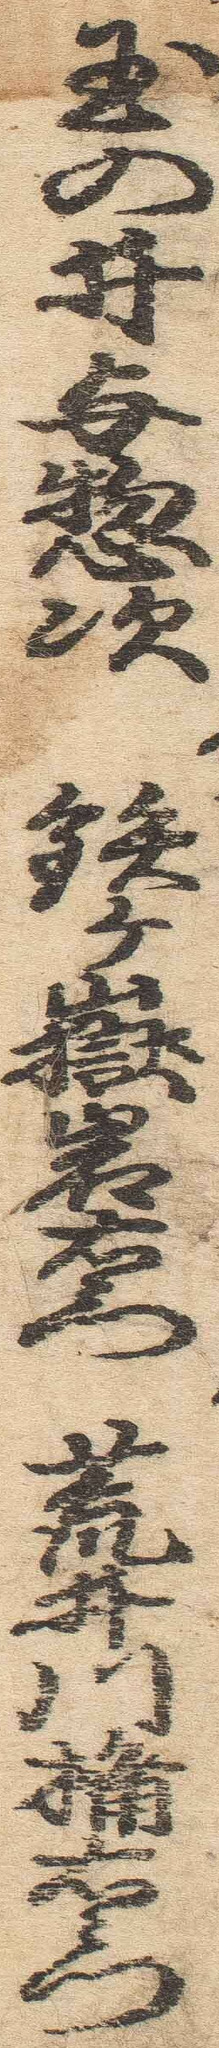玉の井与惣次鉄ケ嶽岩右衛門荒井川桶右衛門
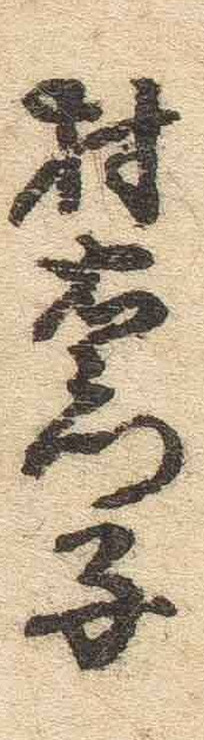村右衛門子
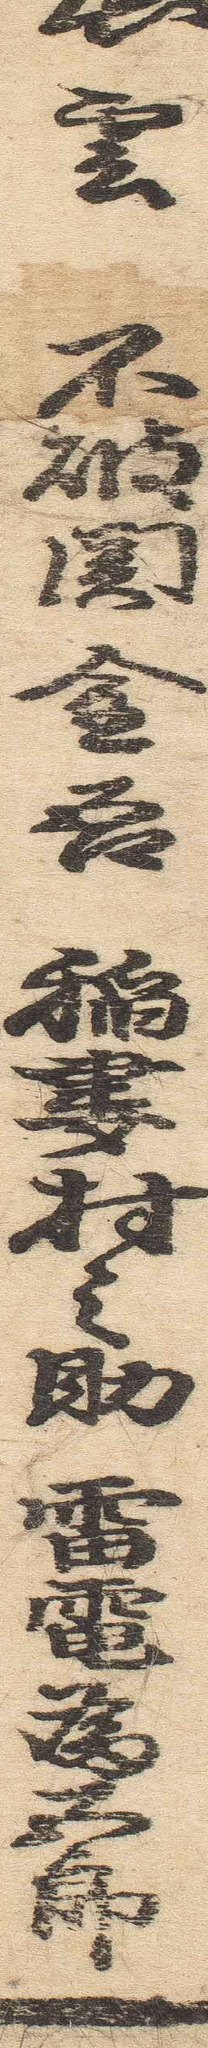出雲不破関金吾稲妻村之助雷電為五郎
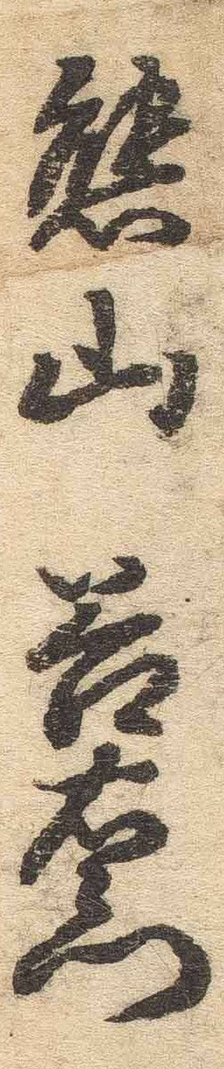熊山谷右衛門
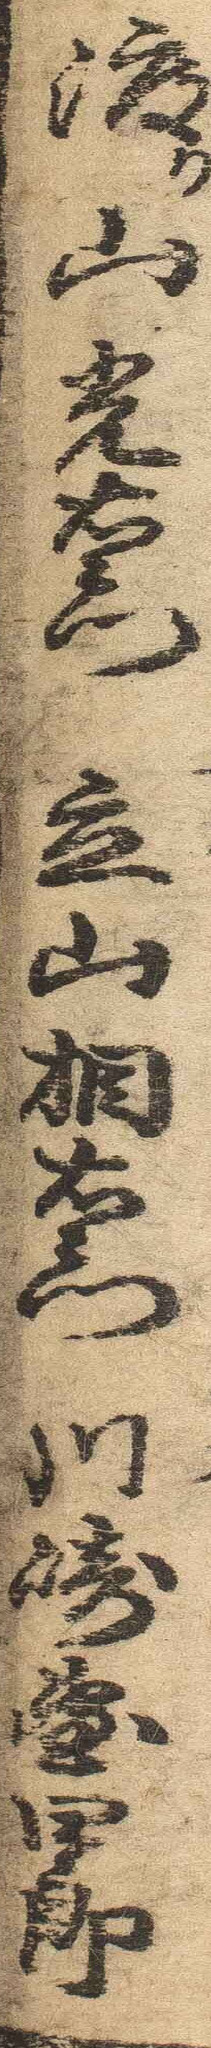渡り山光右衛門立山桐右衛門川崎団四郎
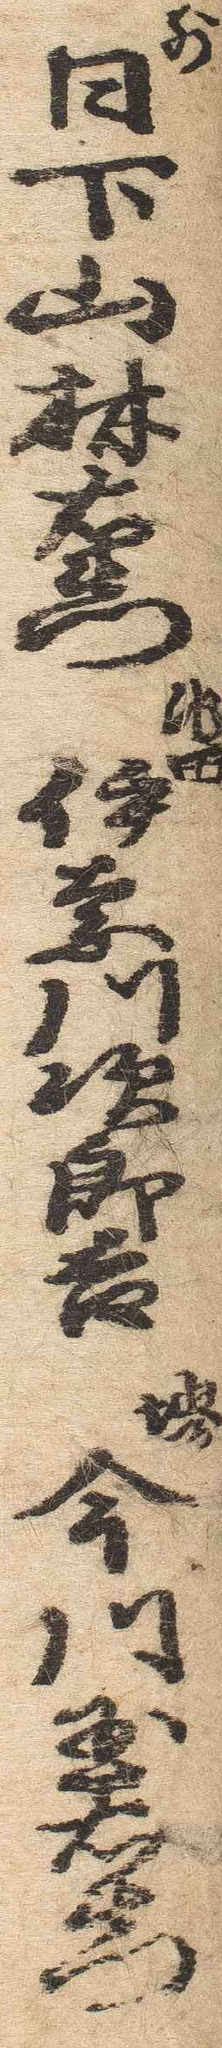日下山林右衛門伊奈川次郎吉今川玉右衛門
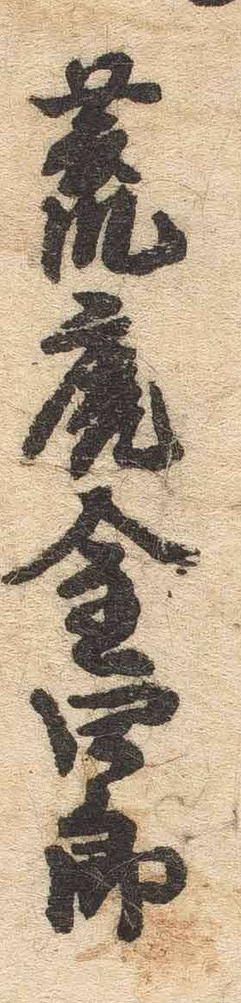荒鹿金四郎
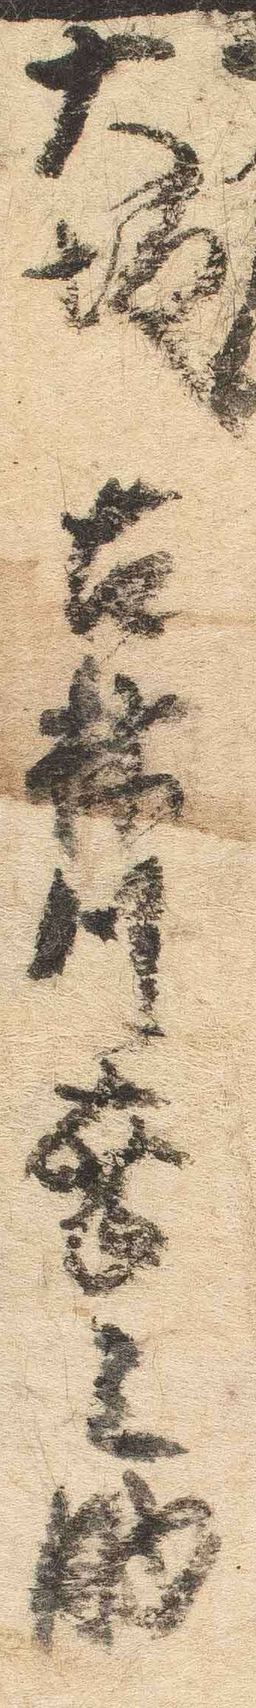大阪古林川峯之助
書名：古今相撲大全
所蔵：東京学芸大学附属図書館 国文学研究資料館
